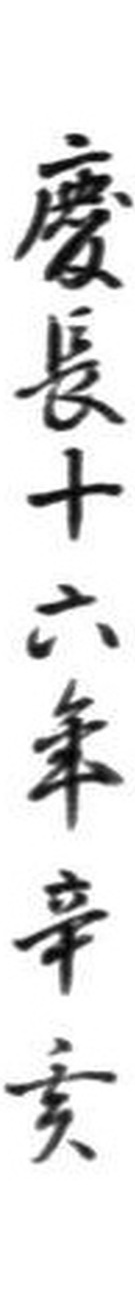慶長十六年辛亥
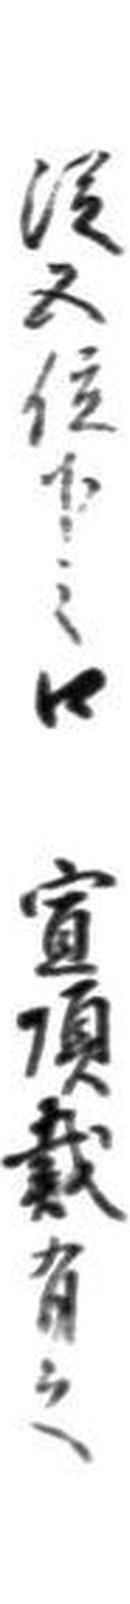従五位下之口宣頂戴有之
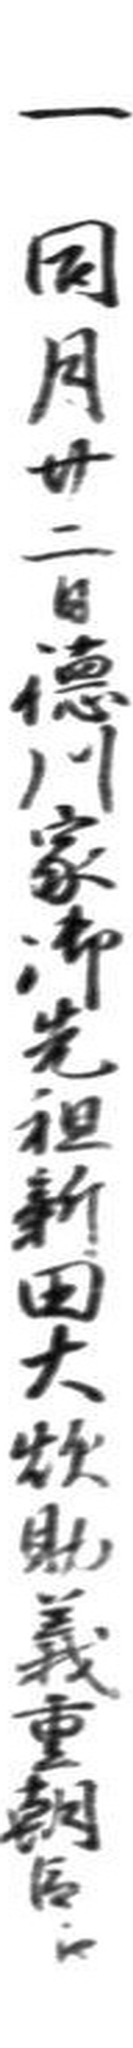一同月廿二日徳川家御先祖新田大炊助義重朝臣江
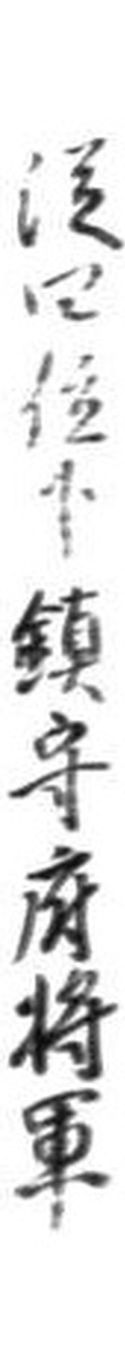従四位下鎮守府将軍
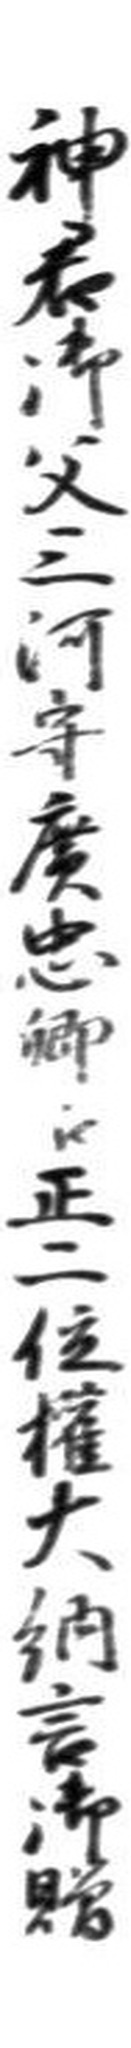神君御父三河守広忠卿江正二位権大納言御贈
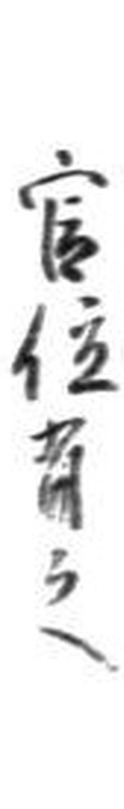官位有之
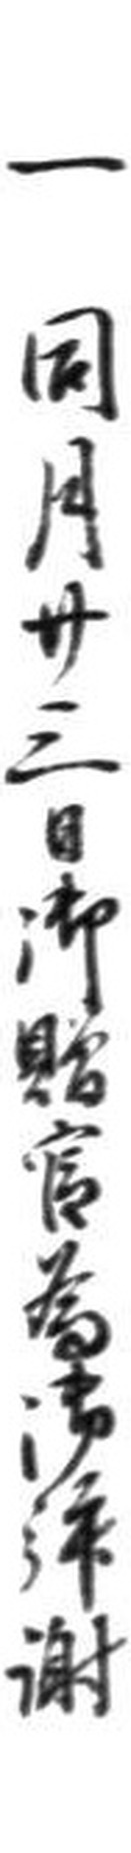一同月廿三日御贈官為御拝謝

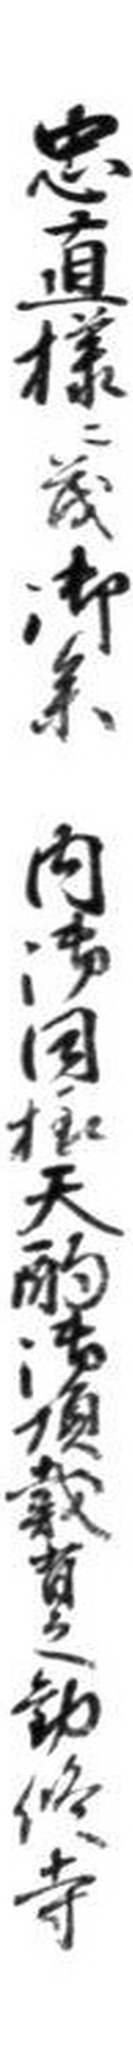忠直様ニ茂御参内御同様天酌御頂戴有之勧修寺
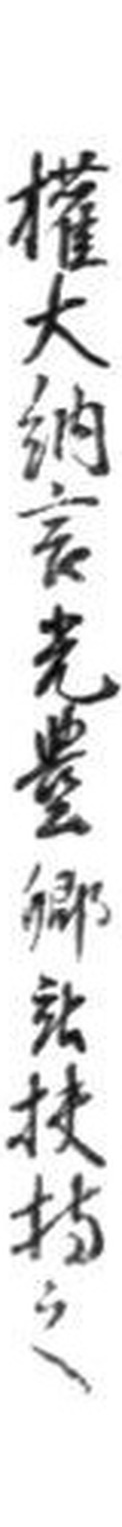権大納言光豊卿被扶持之
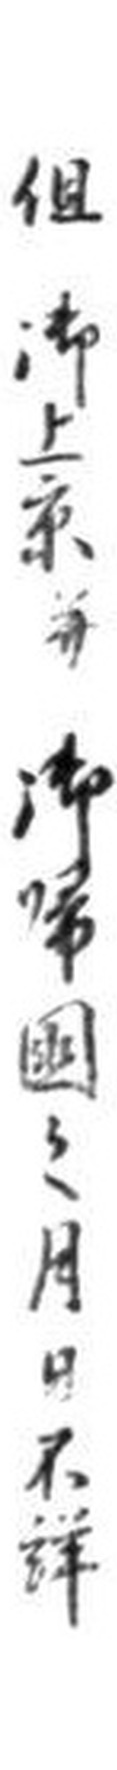但御上京并御帰国之月日不詳
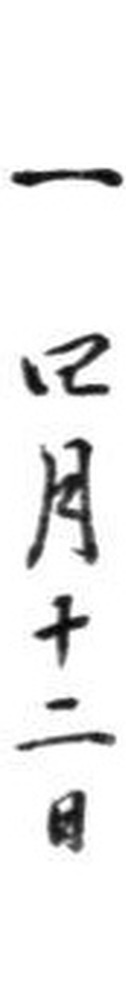一四月十二日
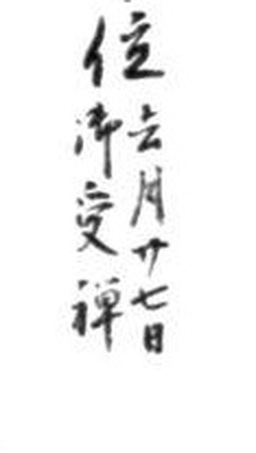御受禅
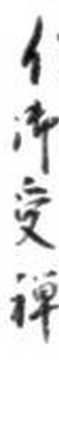御受禅
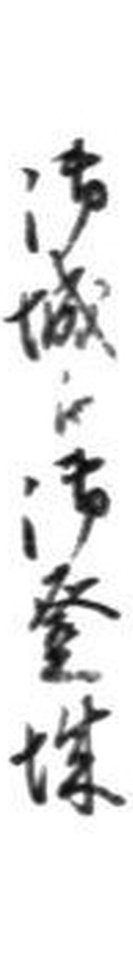御城江御登城
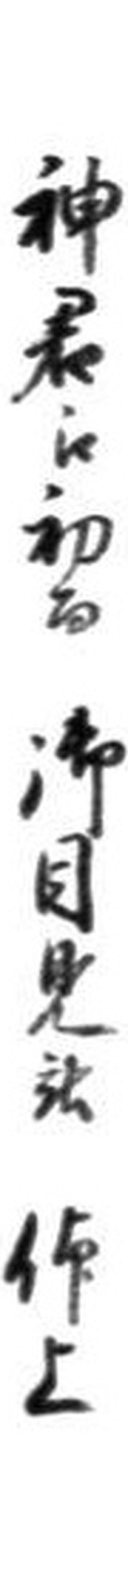神君江初而御目見被仰上
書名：家譜 二 忠直公 従文禄四年到慶安四年
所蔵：福井県文書館 Fukui Prefectural Archives
